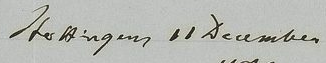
Hottingen, 11 Dezember
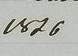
1876
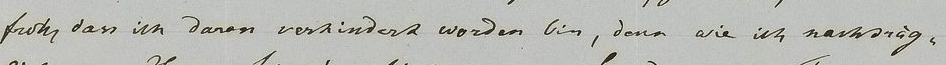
froh, dass ich daran verhindert worden bin, denn wie ich nachträg-
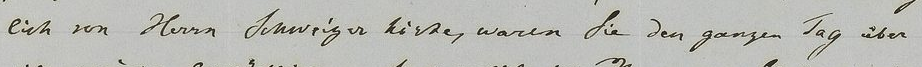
lich von Herrn Schweizer hörte, waren Sie den ganzen Tag über
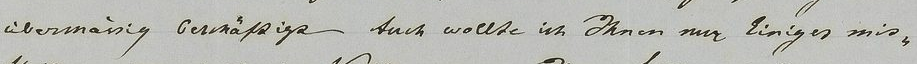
übermässig beschäftigt. Auch wollte ich Ihnen nur Einiges mit-
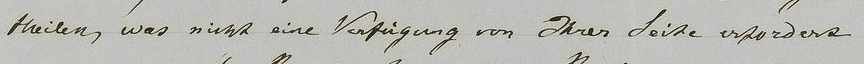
theilen,was nicht eine Verfügung von Ihrer Seite erfordert.
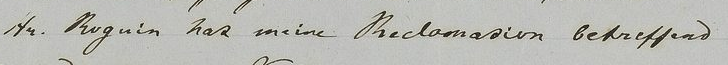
Hr. Rognin hat meine Reclamation betreffend
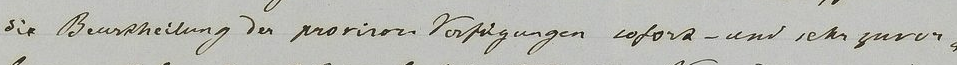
die Beurtheilung der provisor. Verfügungen sofort – und sehr zuvor-
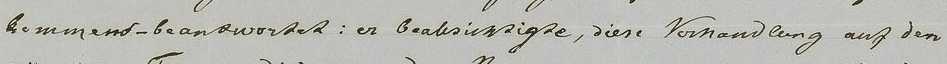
kommend – beantwortet: er beabsichtigte, diese Verhandlung auf den
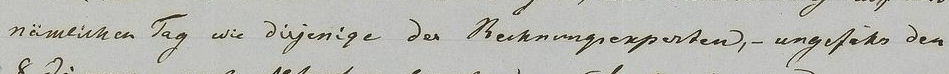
nämlichen Tag wie diejenige der Rechnungsexperten, – ungefähr den
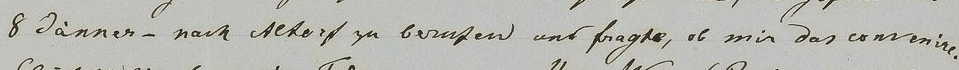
8. Jänner – nach Altorf zu berufen und fragte, ob mir das convenire.
